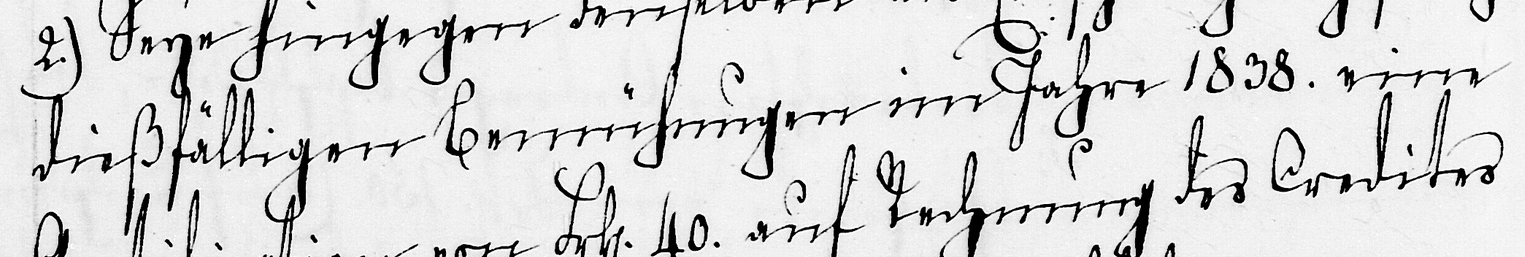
dießfälligen Bemühungen im Jahre 1838. eine
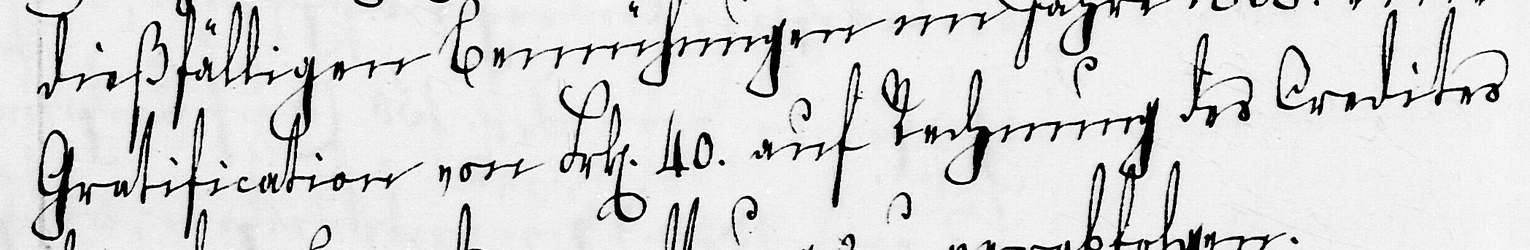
Gratification von Frk[en] 40. auf Rechnung des Credites
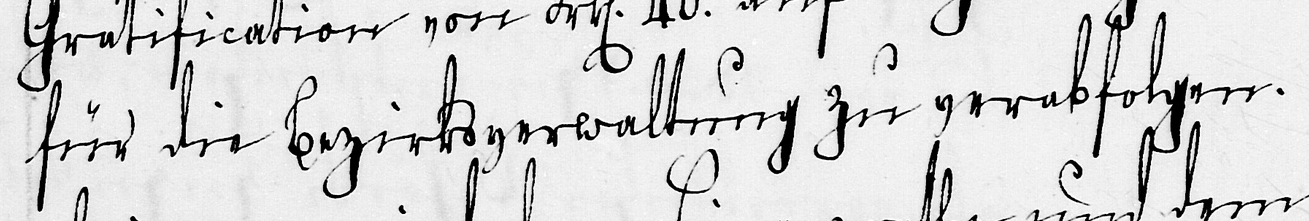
für die Bezirksverwaltung zu verabfolgen.
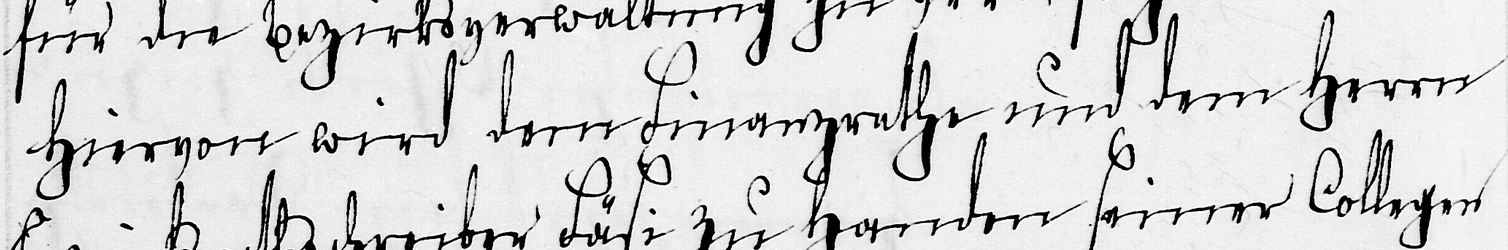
Hiervon wird dem Finanzrathe und dem Herrn
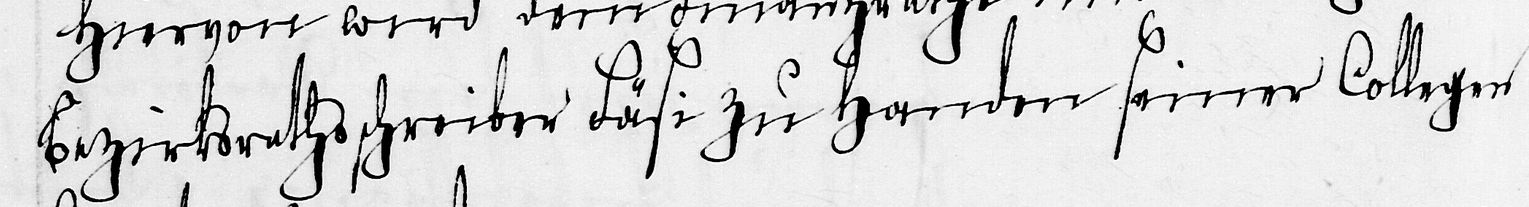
Bezirksrathsschreiber Fäsi zu Handen seiner Collegen
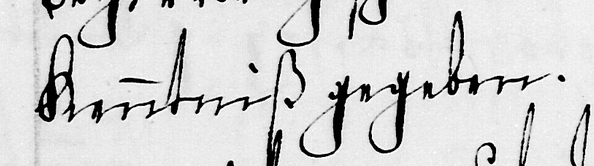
Kenntniß gegeben.
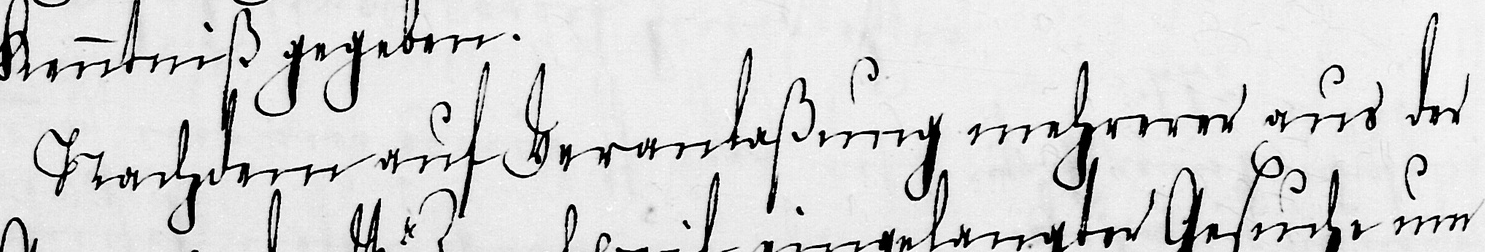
Nachdem auf Veranlaßung mehrerer aus der
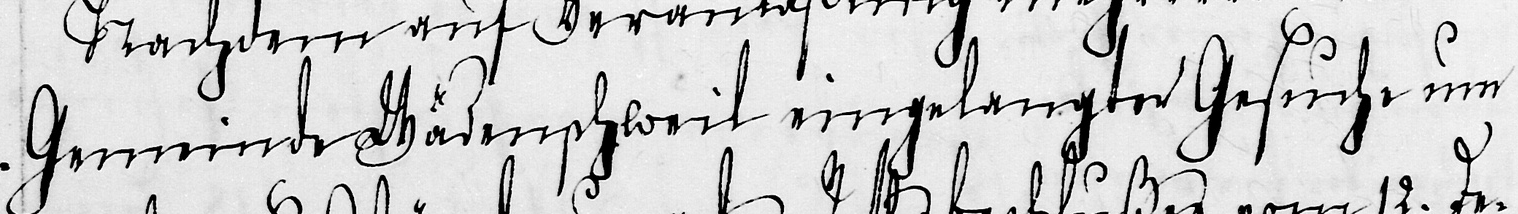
Gemeinde Wädenschweil eingelangter Gesuche um
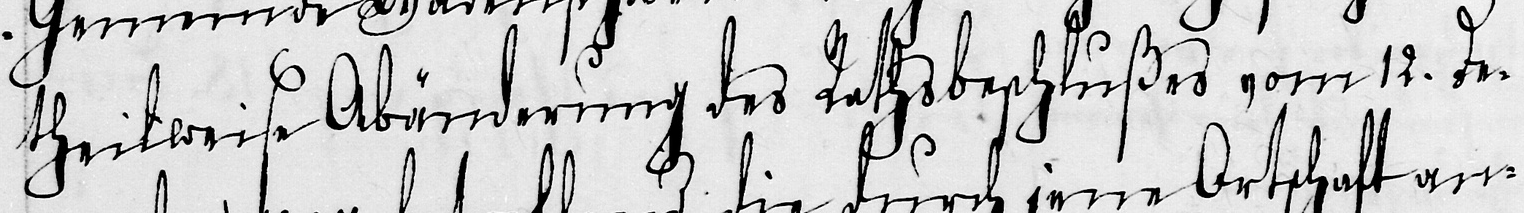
theilweise Abänderung des Rathsbeschlußes vom 12. D¬
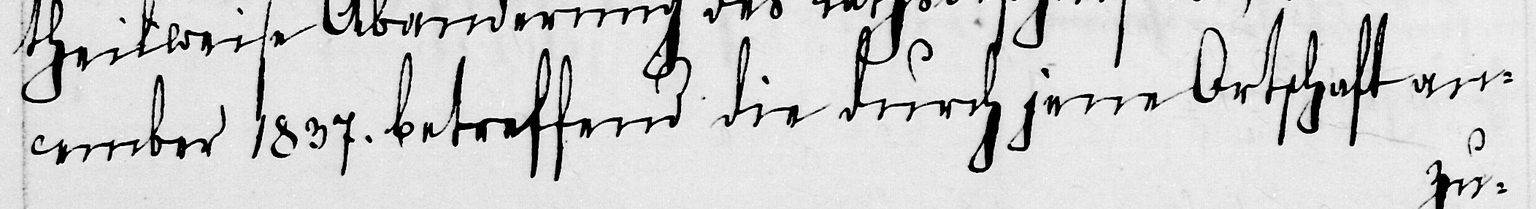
ecember 1837. betreffend die durch jene Ortschaft an-
